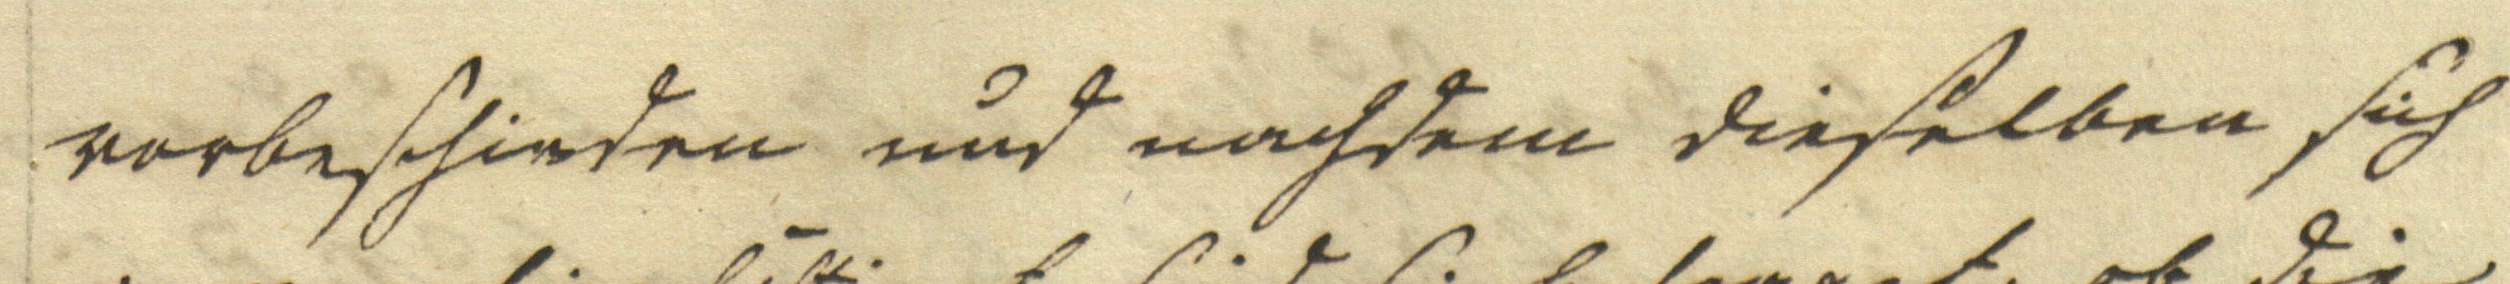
vorbeschieden und nachdem dieselben sich
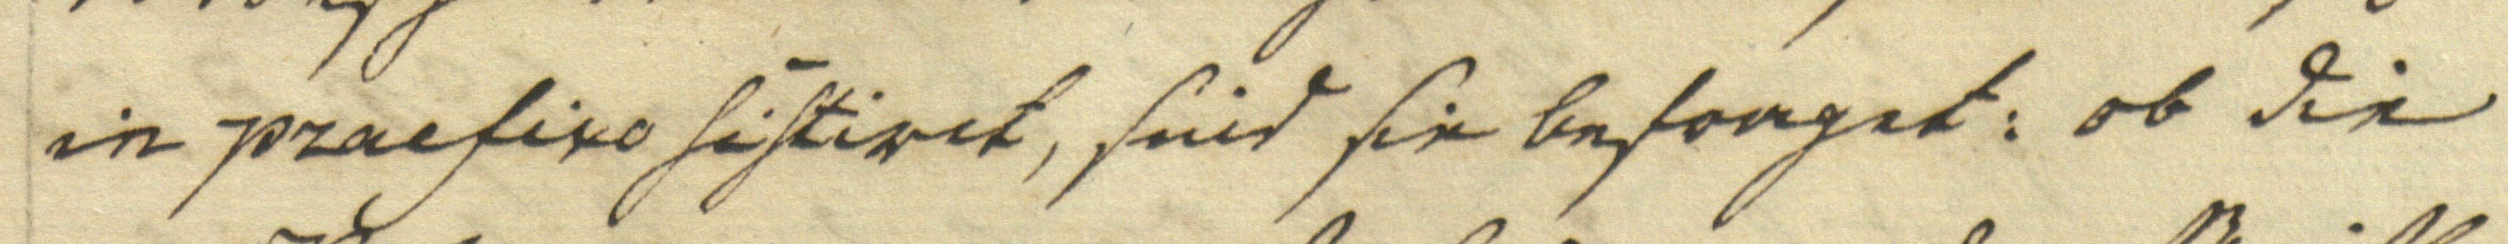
in praefivo sistiret, sind sie befraget: ob die
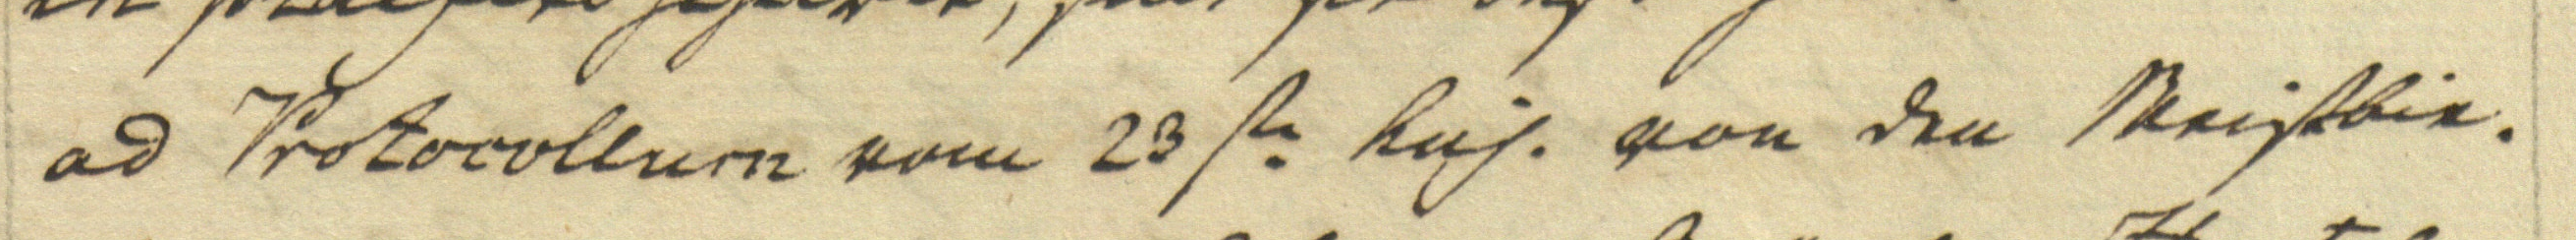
ad Protocollum vom 23 st huj. von den Meistbie¬
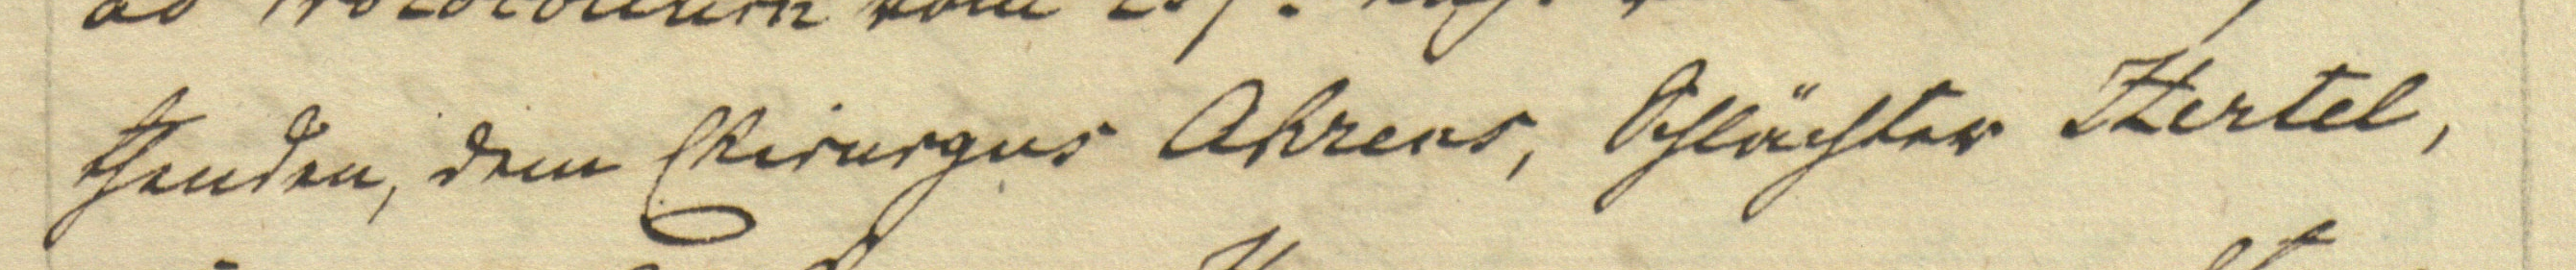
thenden, dem Chirurgus Ahrens, Schlächter Hertel,
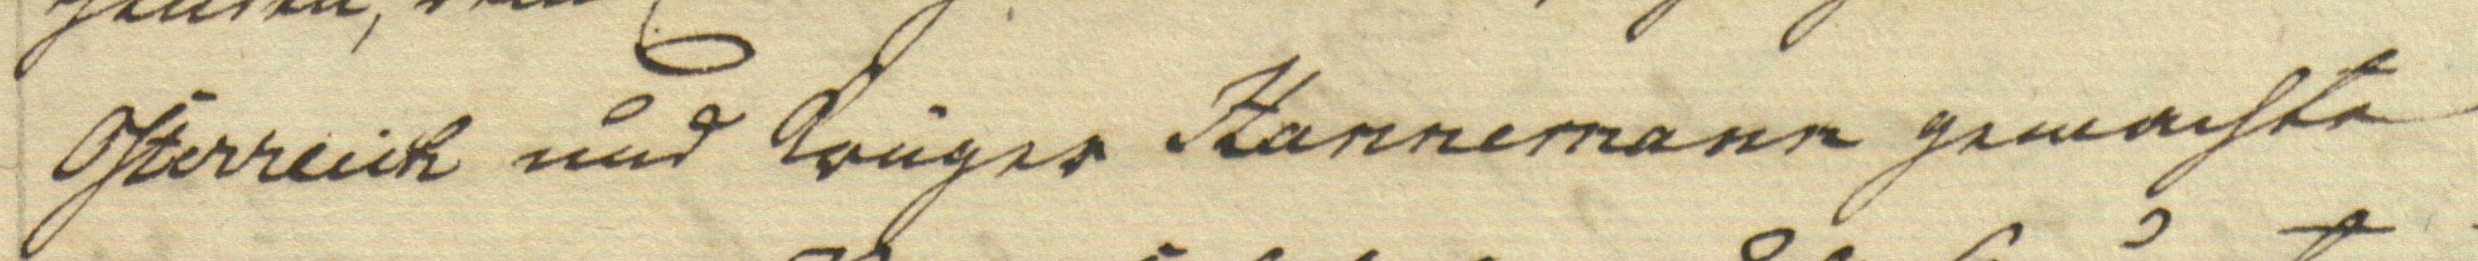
Österreich und Krüger Hannemann gemachte
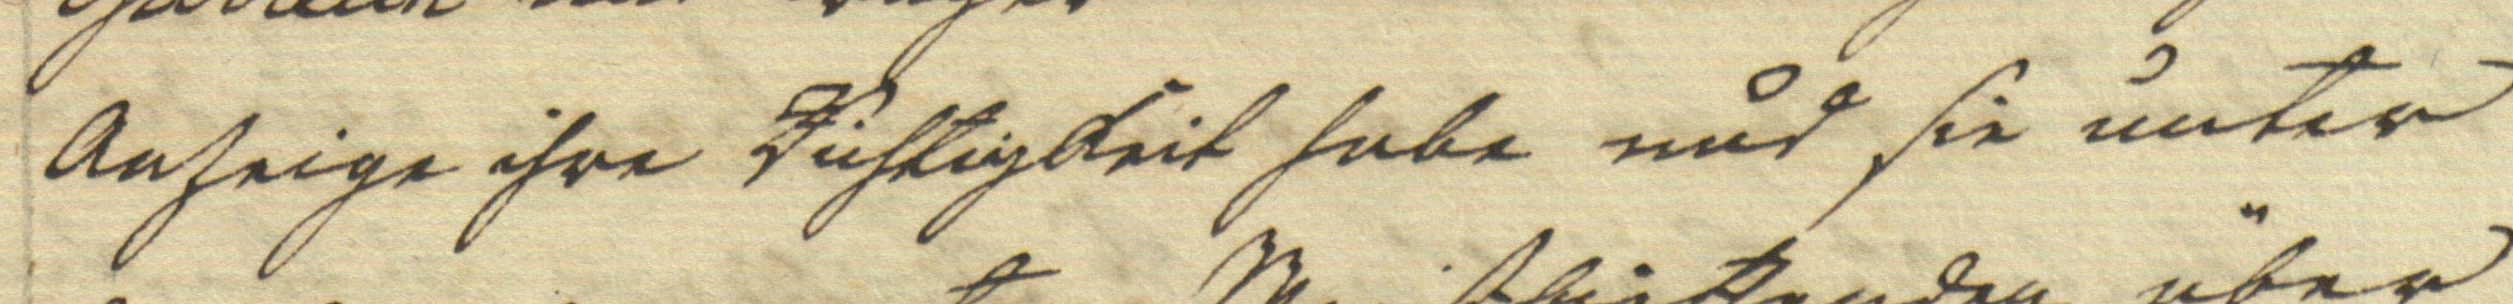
Anzeige ihre Richtigkeit habe und sie unter
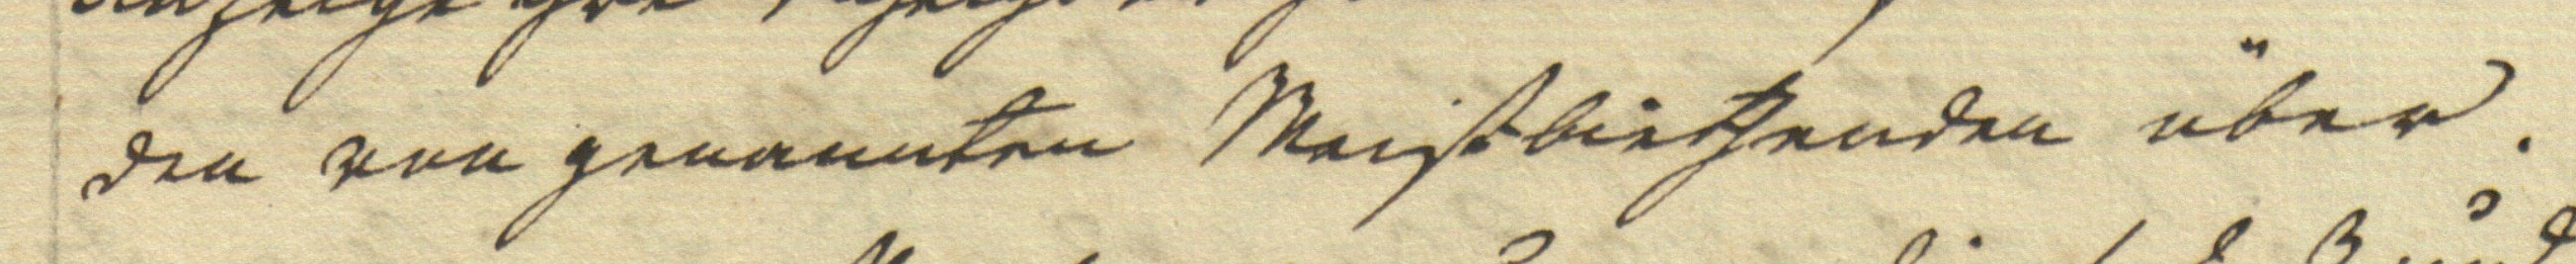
den von genannten Meistbiethenden über¬
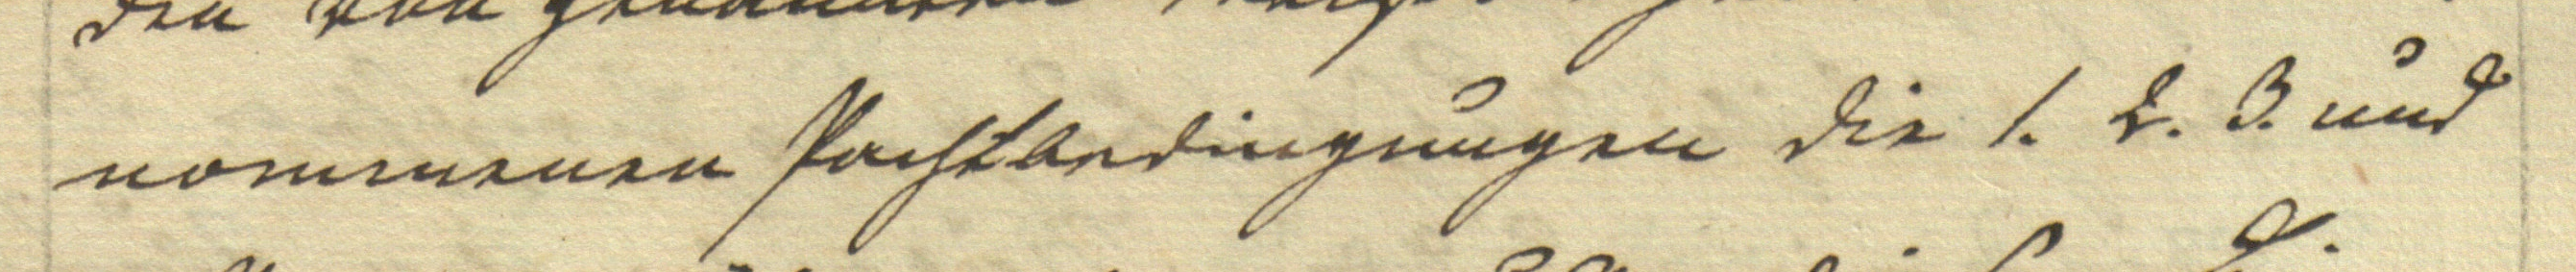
nommenen Pachtbedingungen die 1. 2. 3. und
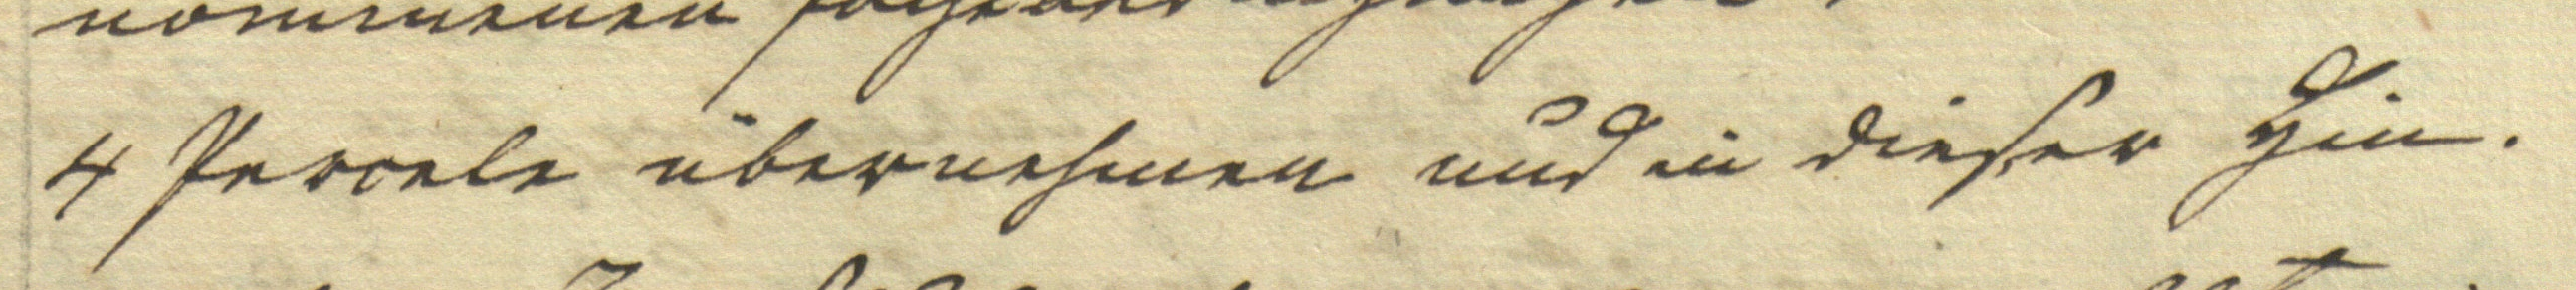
4 Percele übernehmen und in dieser Hin¬
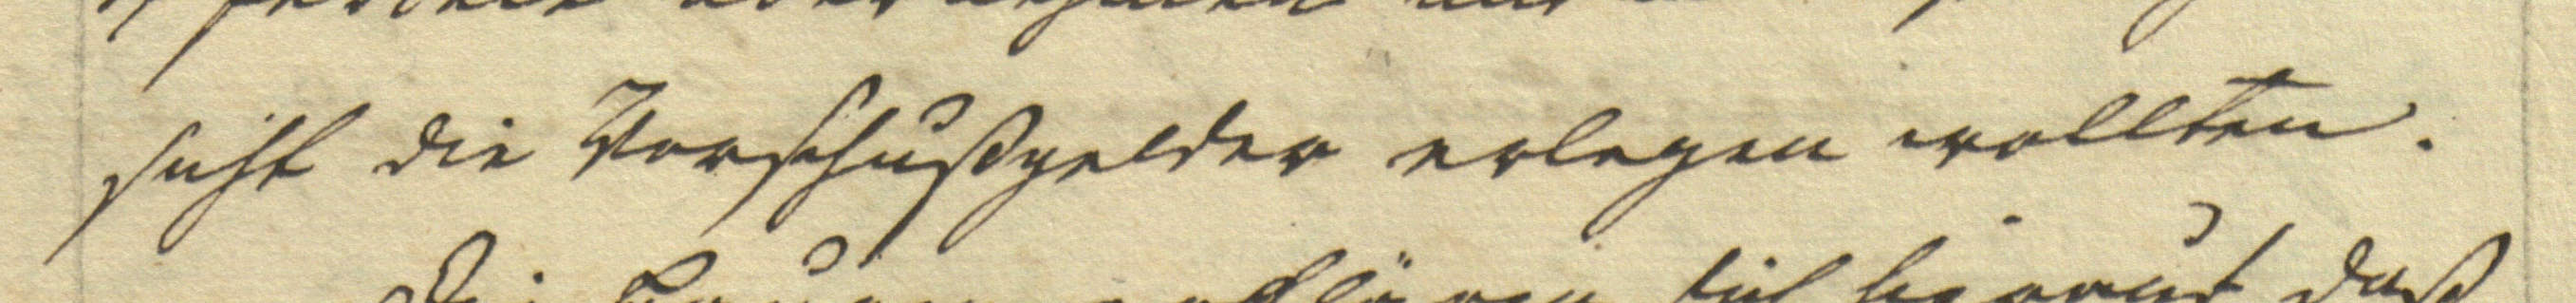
sicht die Vorschußgelder erlegen wollten.
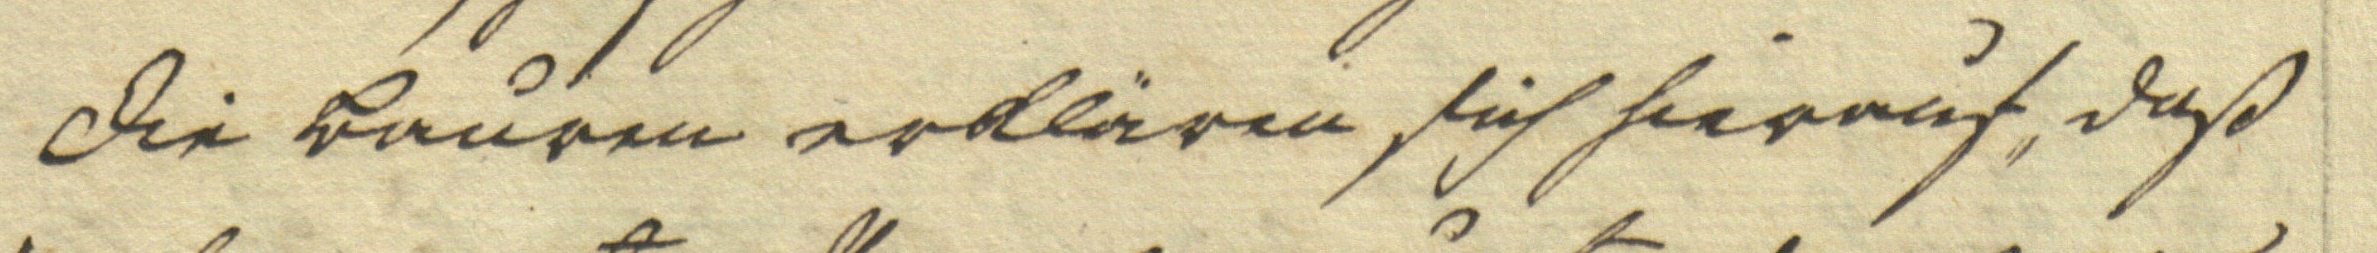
Die Bauren erklären sich hierauf, daß
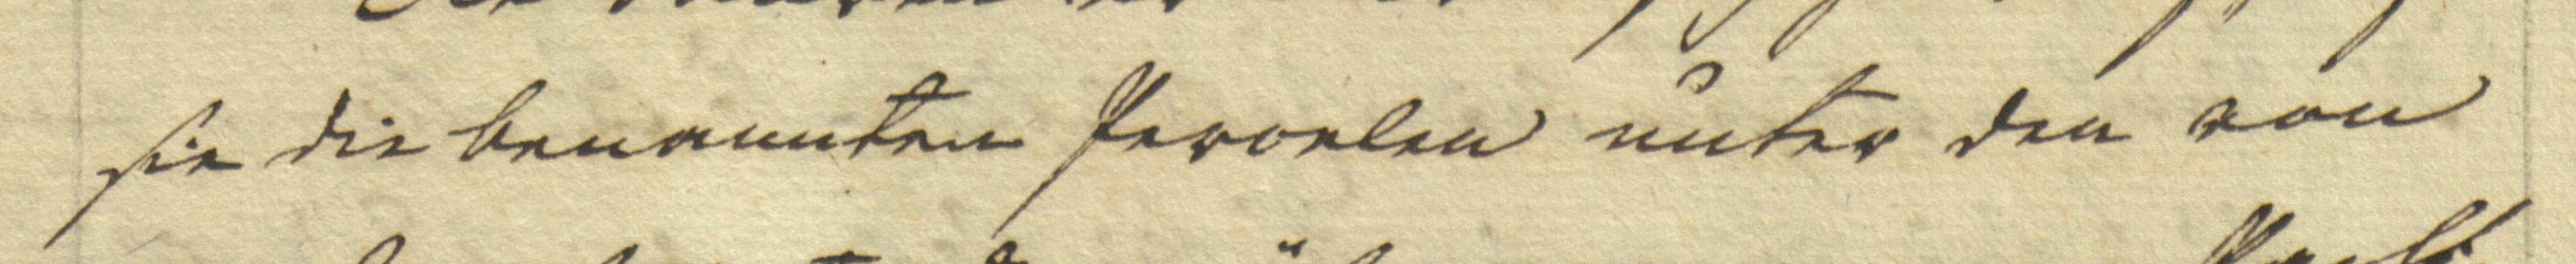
sie die benannten Percelen unter den von
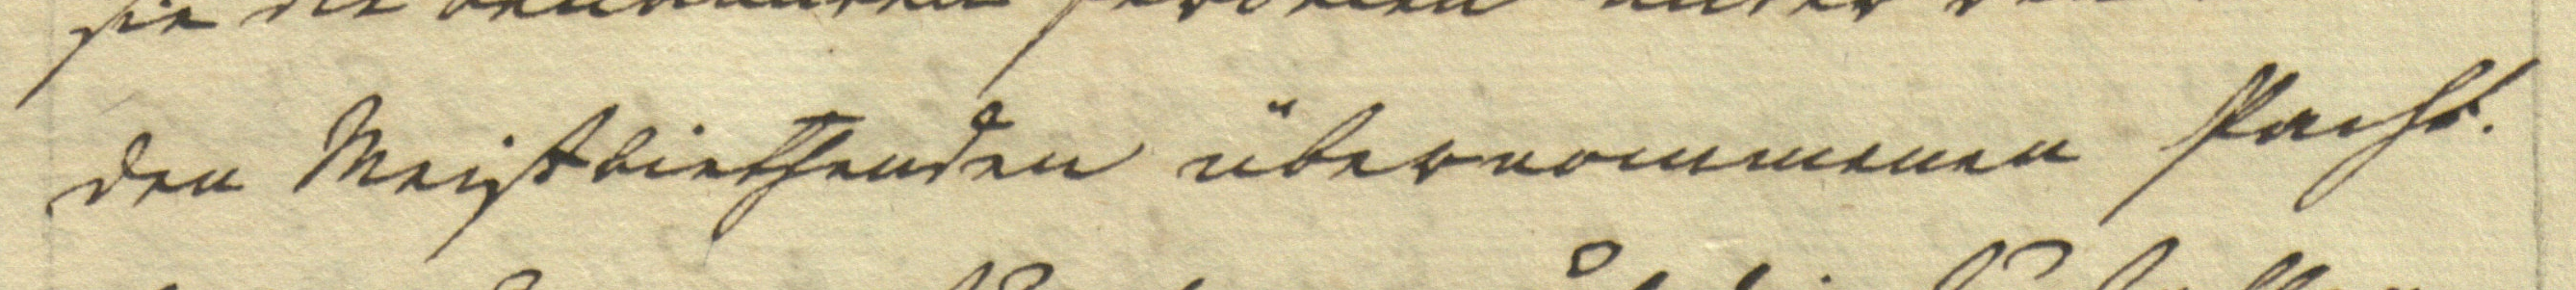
den Meistbiethenden übernommenen Pacht¬
